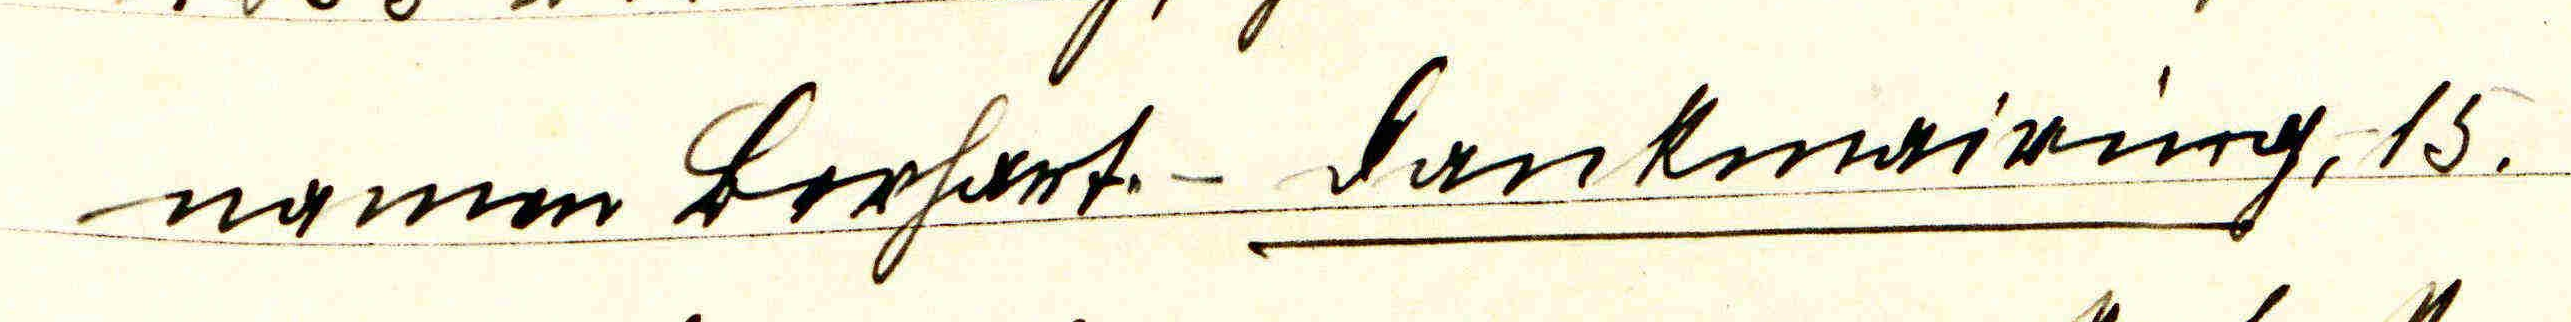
namen Berhart - Dankmairing, 15.
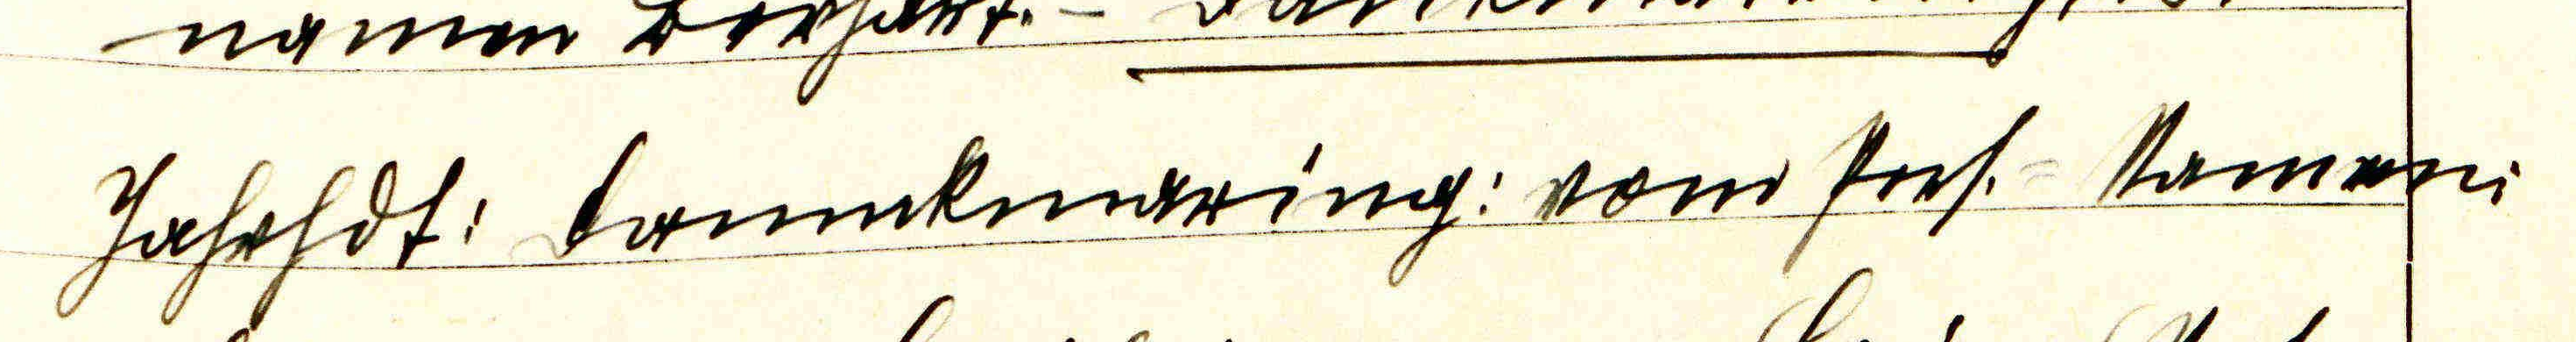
Jahrhdt: Dannkmaring; vom Pers. Namen
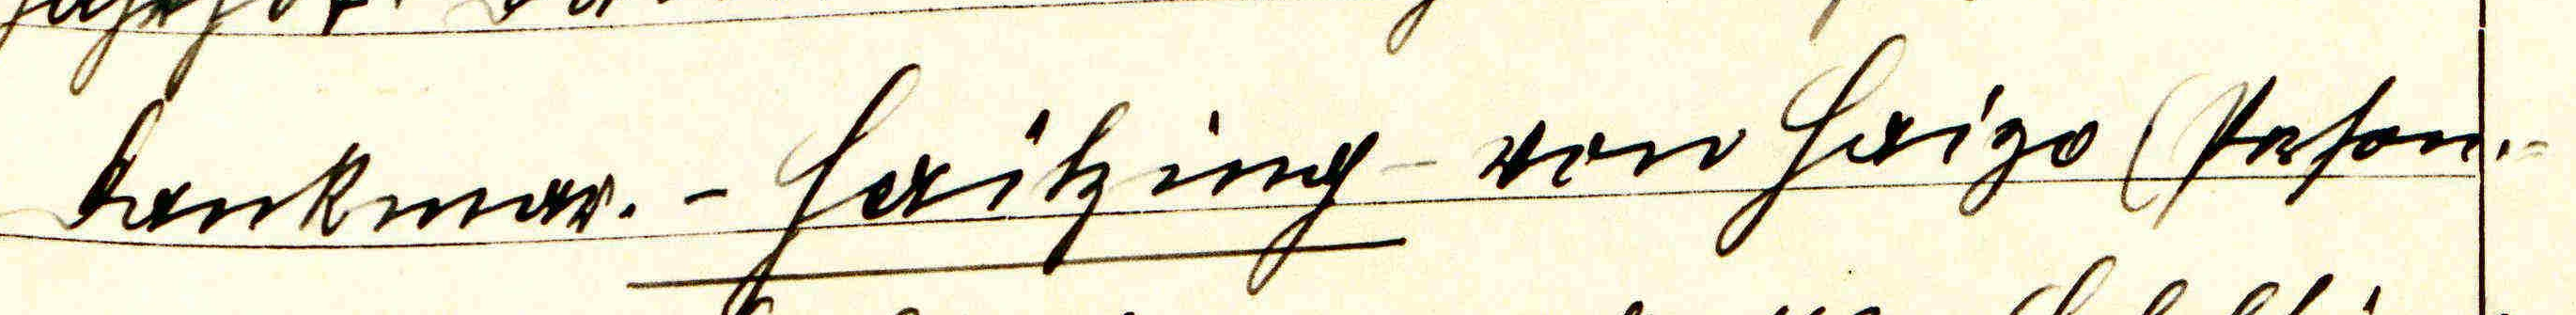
Dankmar. - Haitzing von Haigo (Person-
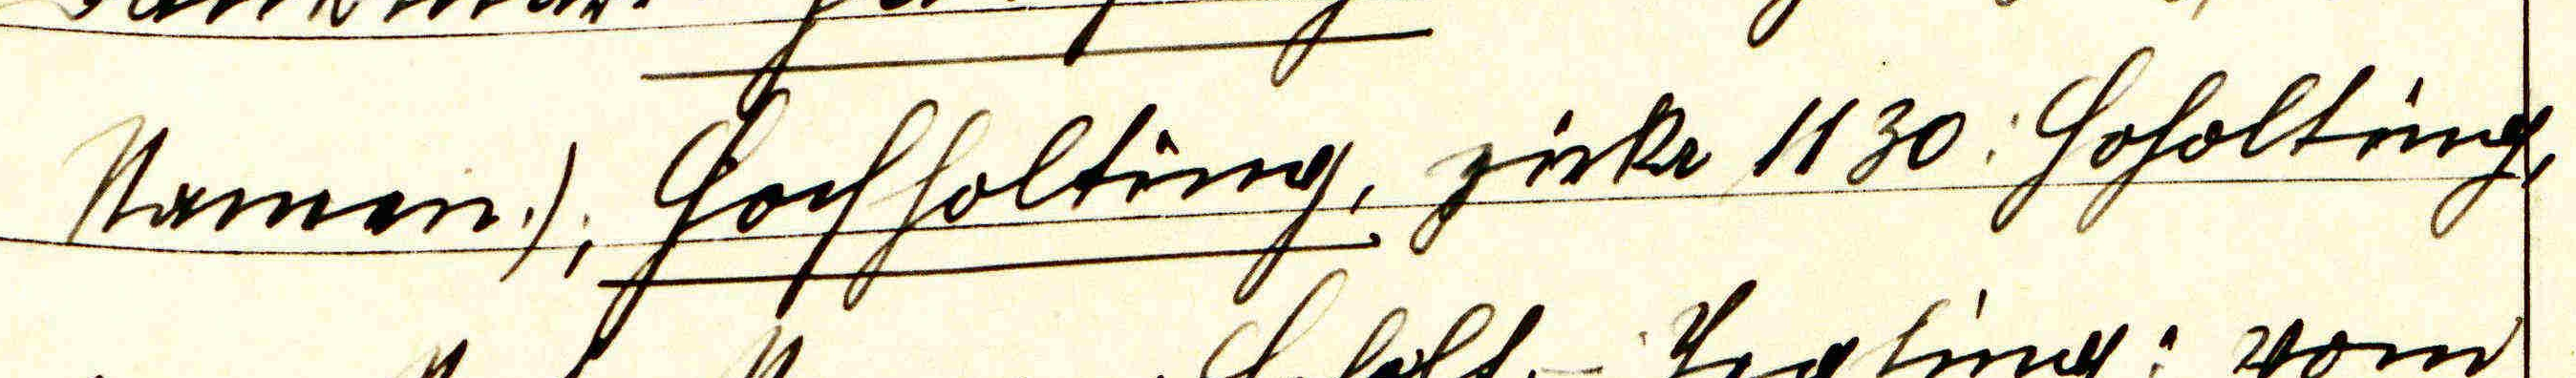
Namen); Hochholting, zirka 1130 Hoholting,
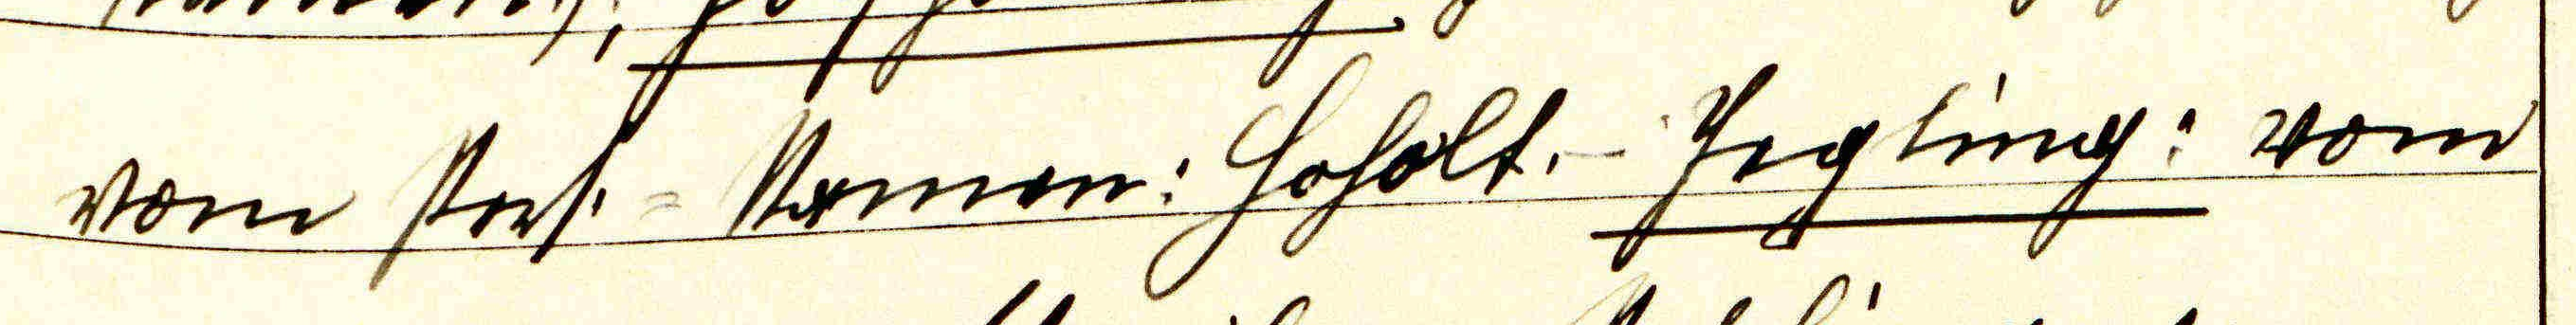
vom Pers.- Namen: Hoholt. - Jegling: vom
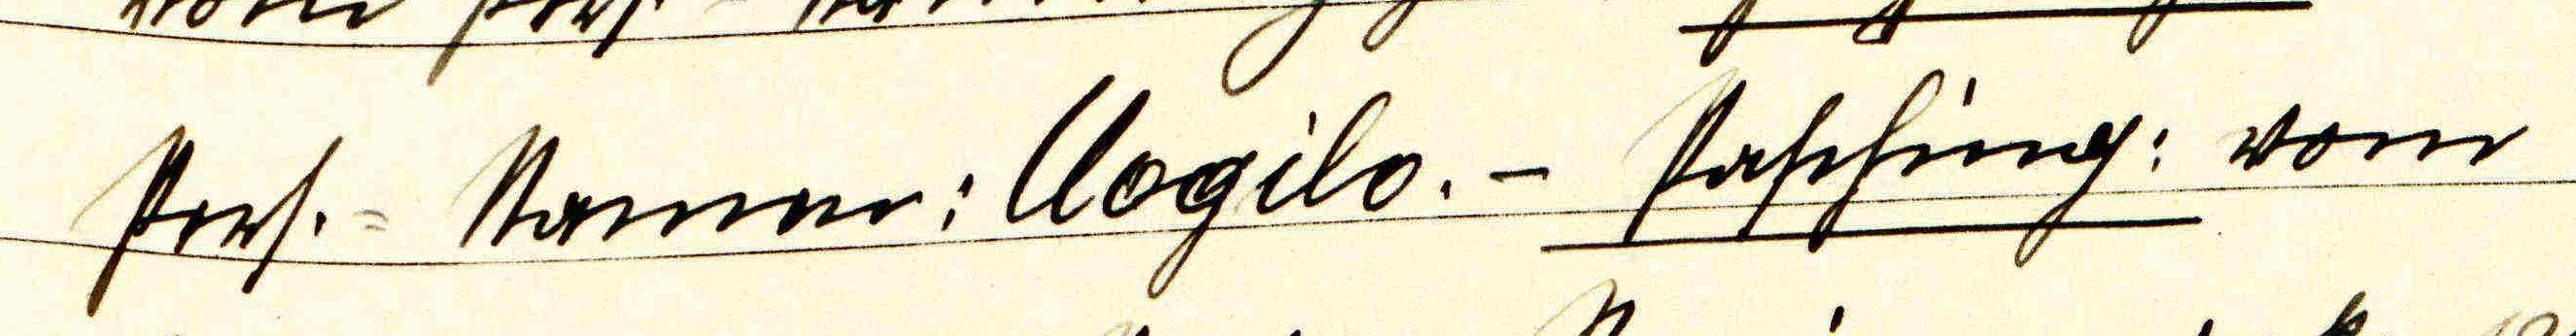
Pers. - Namen: Uogilo. - Pasching: vom
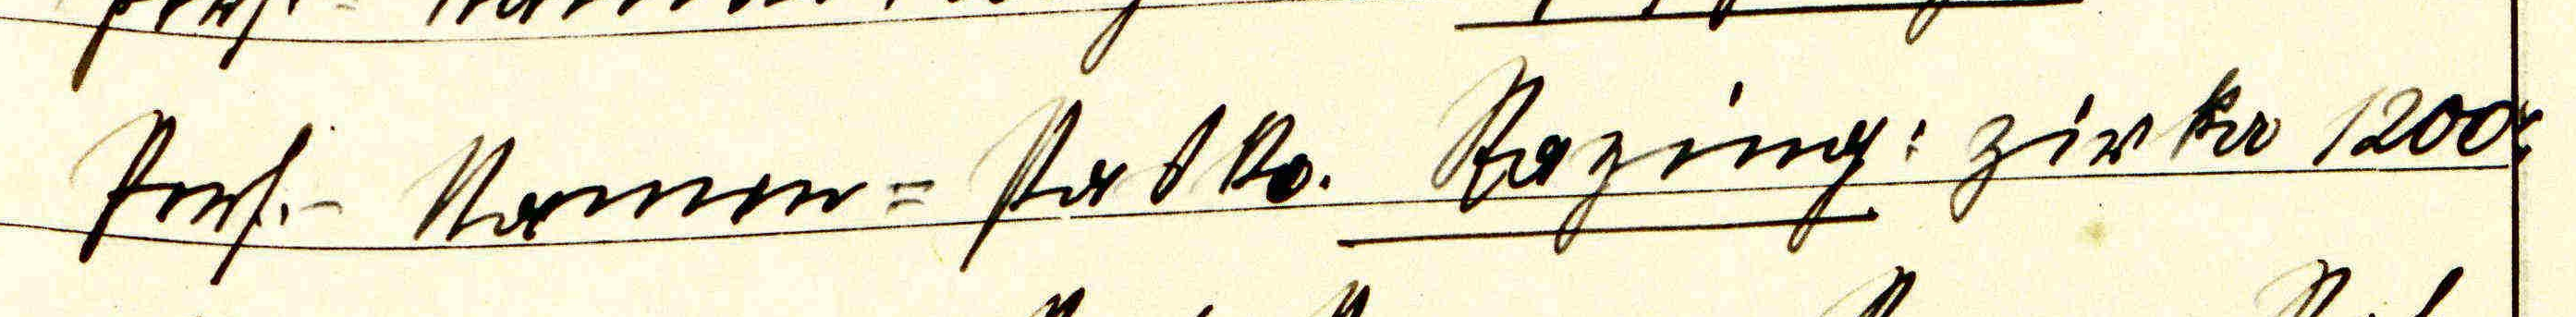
Pers. - Namen- Pasko. Razing: zirka 1200
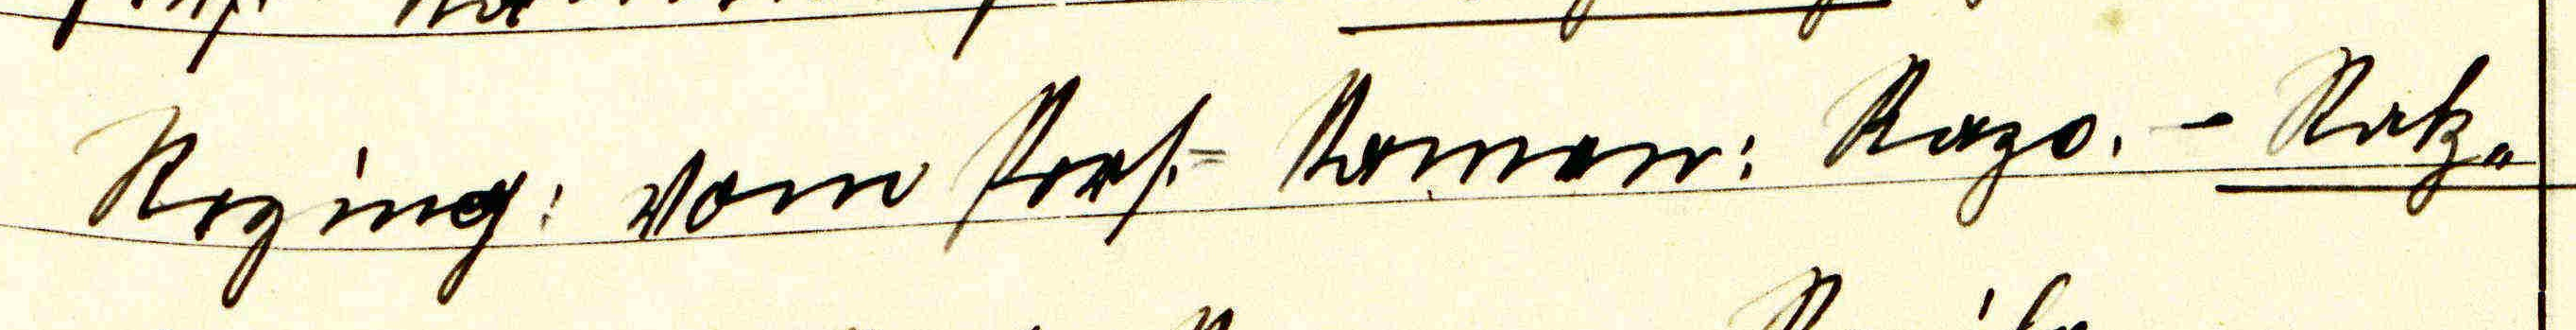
Rezing: vom Pers. - Namen: Razo. - Ratz-
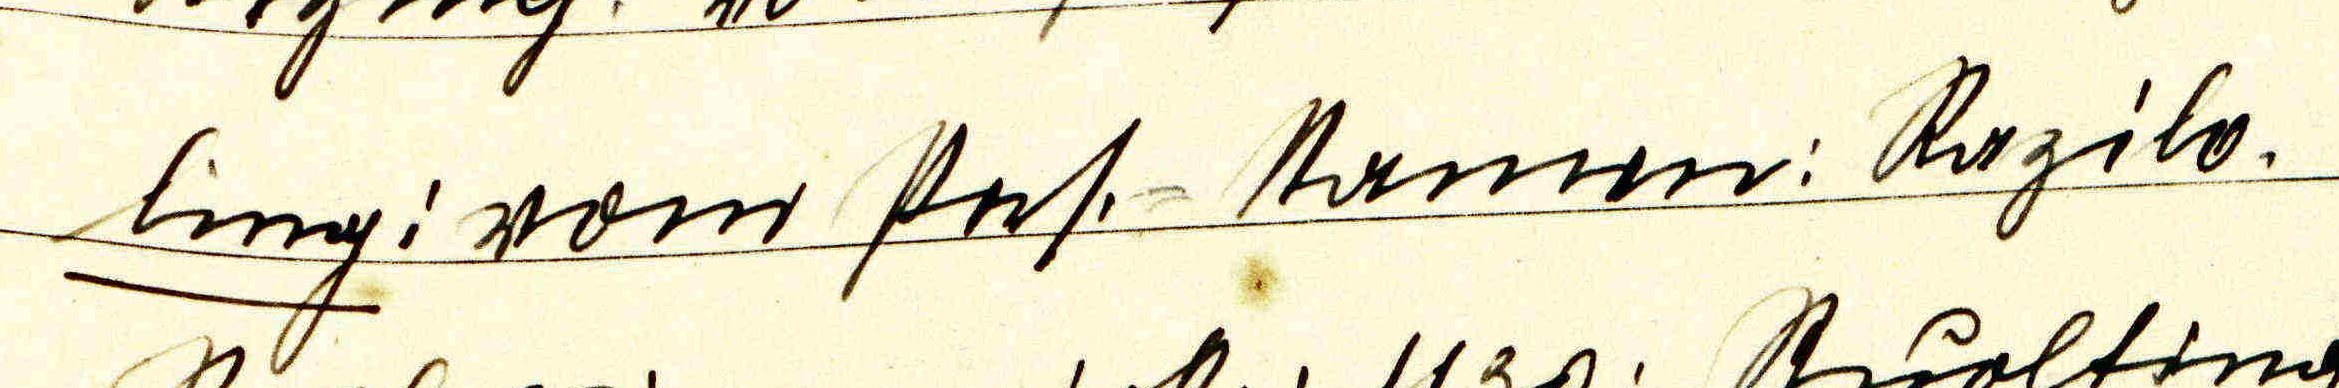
ling: vom Pers. - Namen: Razilo.
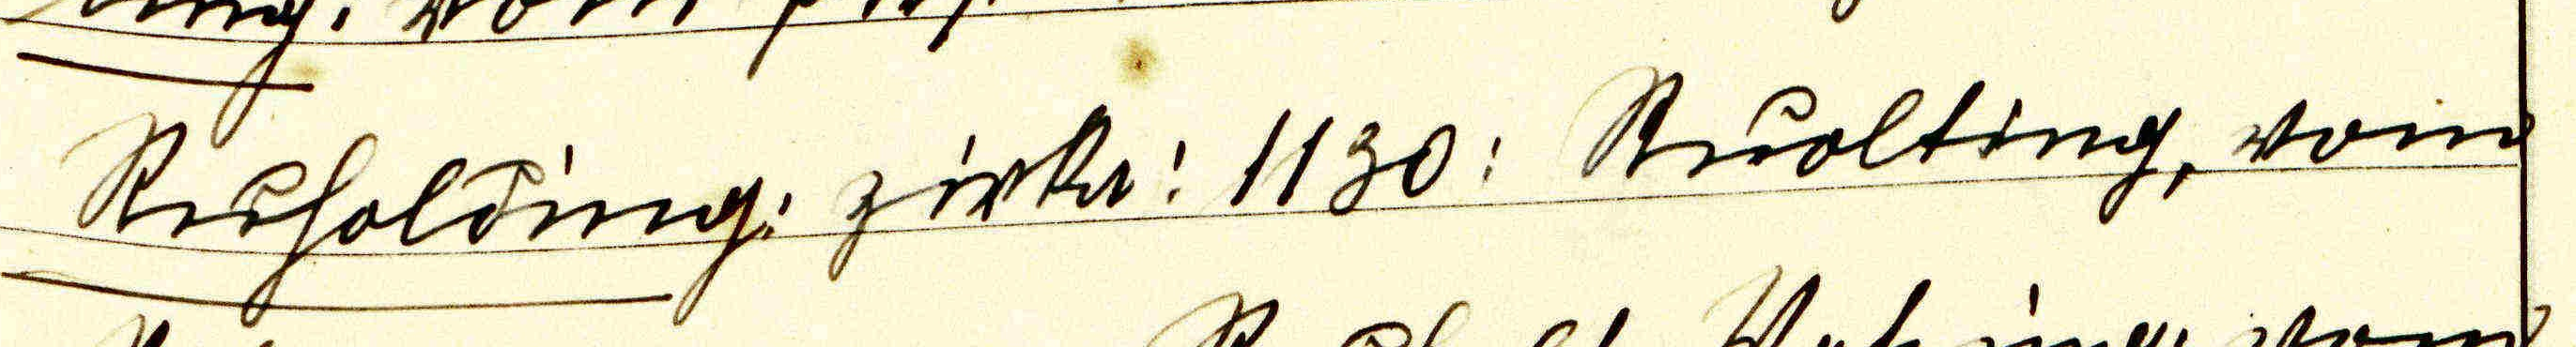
Ruholding: zirka: 1130: Ruolting, vom
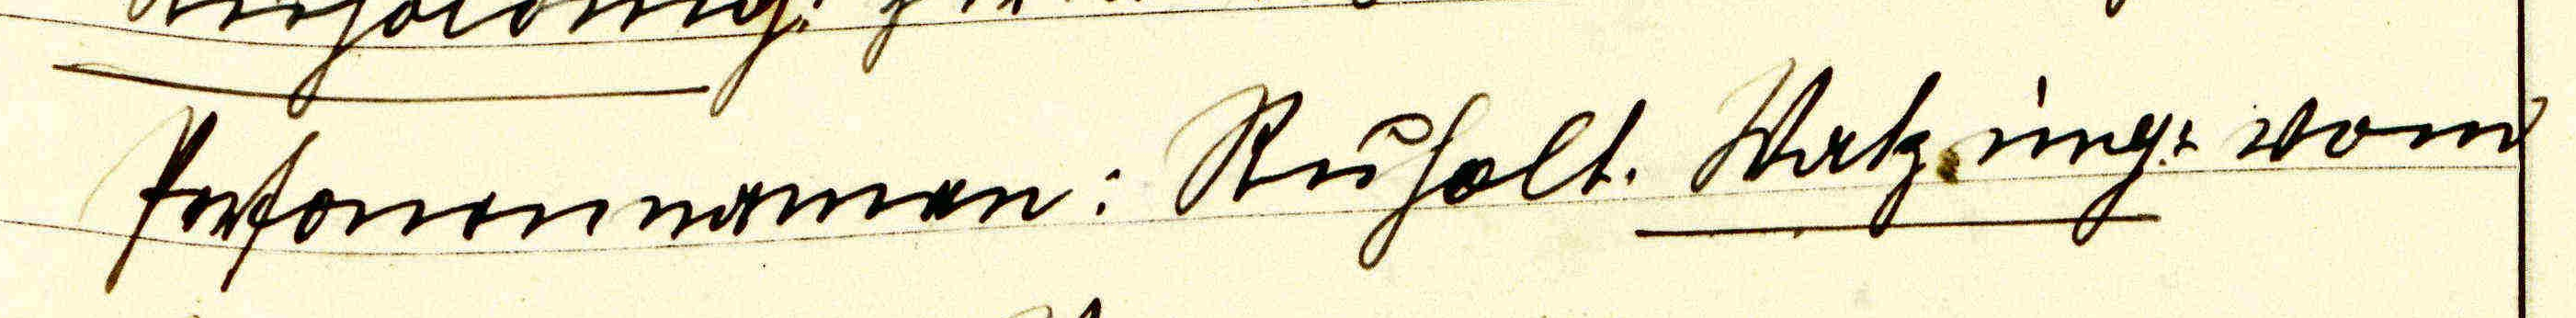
Personennamen: Ruhol. Watzing. vom
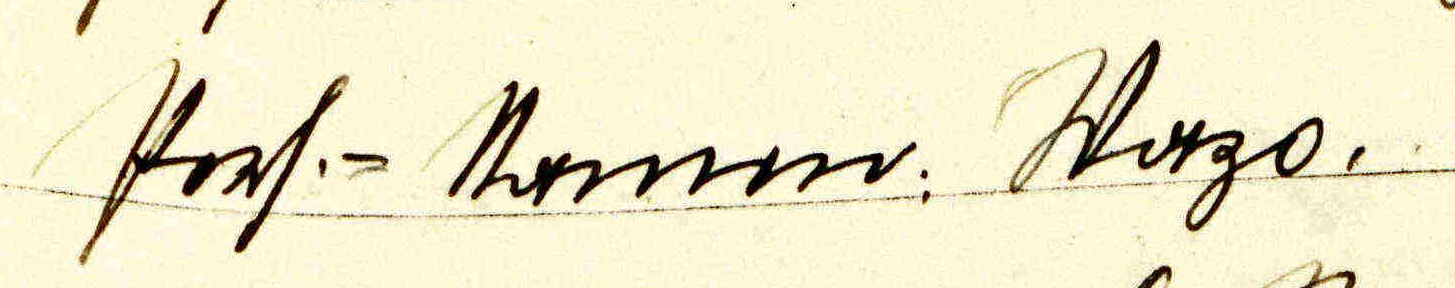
Pers. - Namen Wazo.
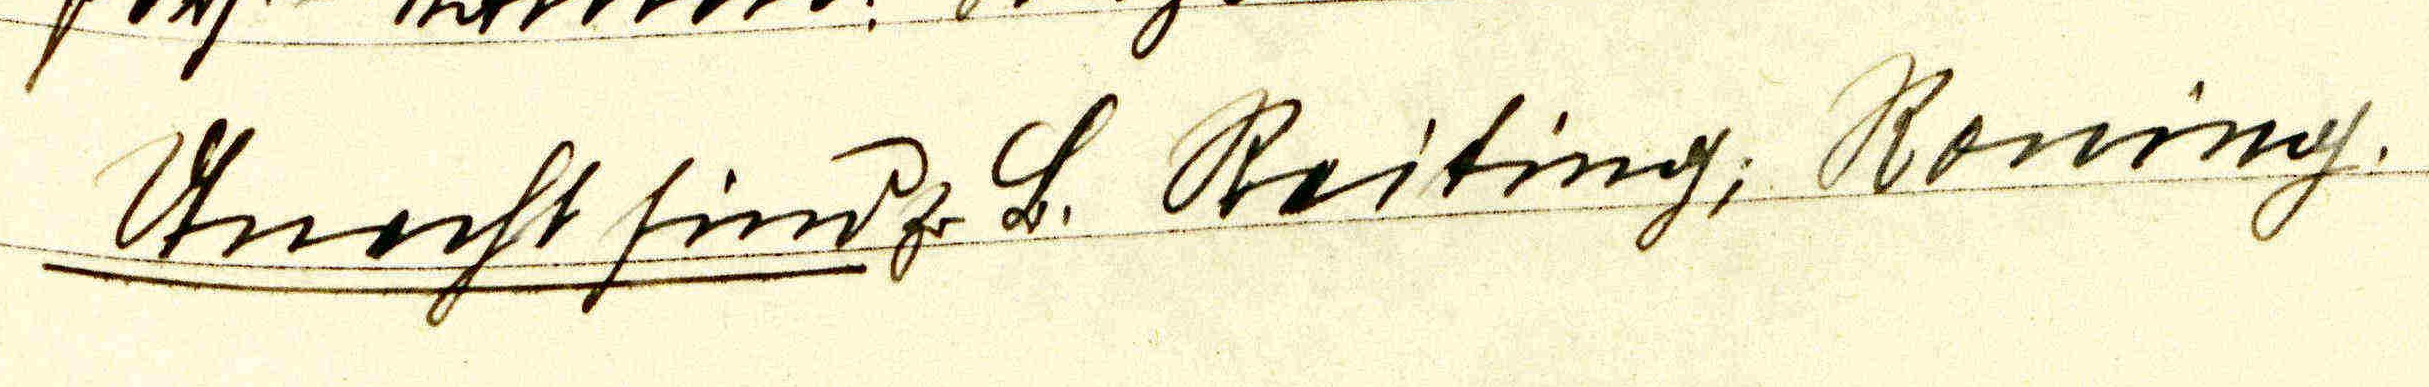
Unecht sind z.B. Reiting; Roning.
